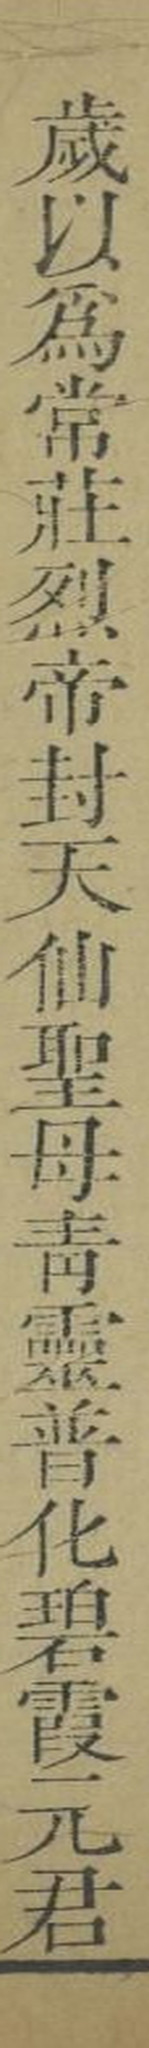歲以爲常莊烈帝封天仙聖母靑靈普化碧霞元君
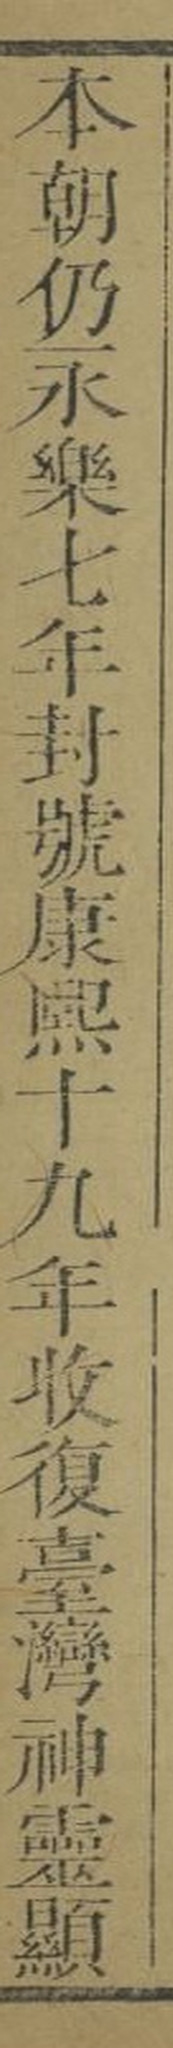本朝仍永樂七年封號康熙十九年收復臺灣神靈顯

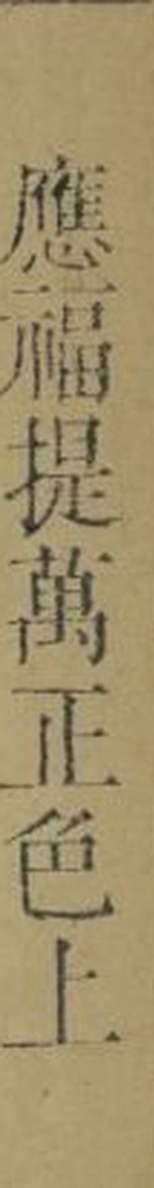應福提萬正色上
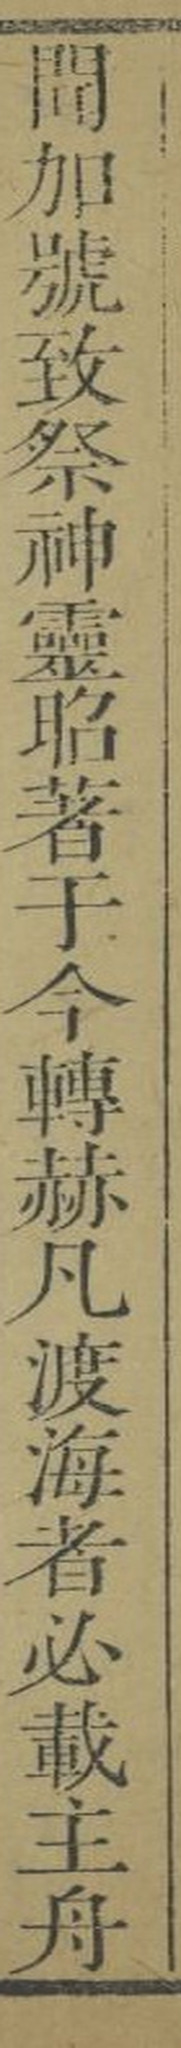聞加號致祭神靈昭著于今轉赫凡渡海者必載主舟
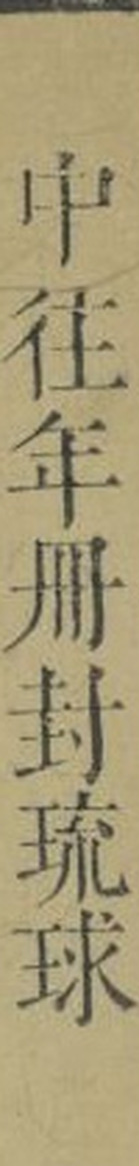中往年冊封琉球
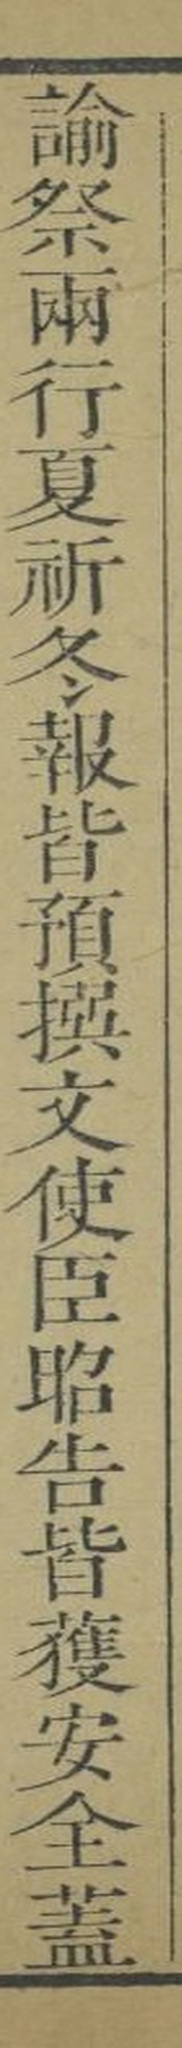諭祭兩行夏祈冬報皆預撰文使臣昭告皆獲安全蓋
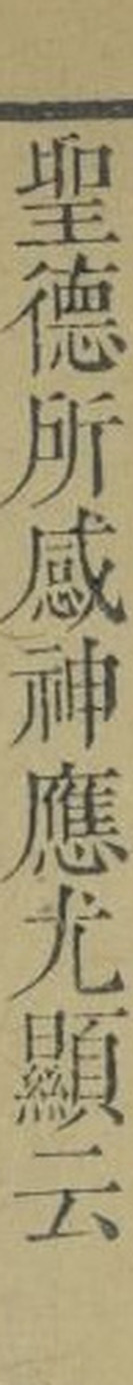聖德所感神應尤顯云
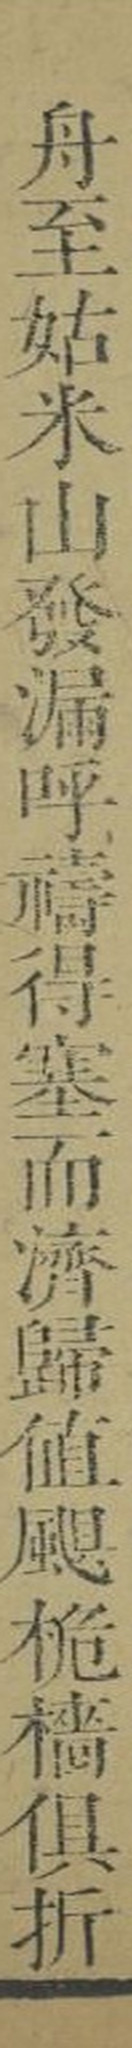舟至姑米山發漏呼禱得塞而濟歸値颶桅檣俱折
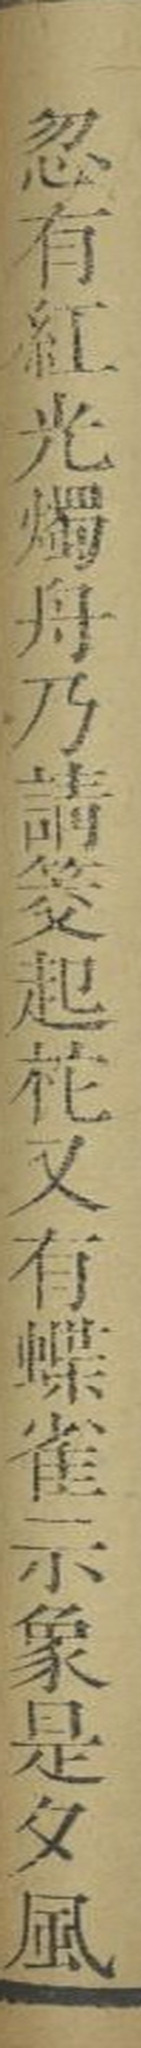忽有紅光燭舟乃請筊起柁又有蝶雀示象是夕風
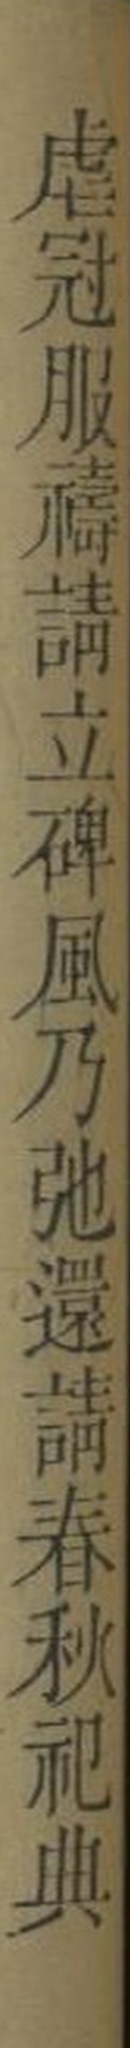虐冠服禱請立碑風乃弛還請春秋祀典
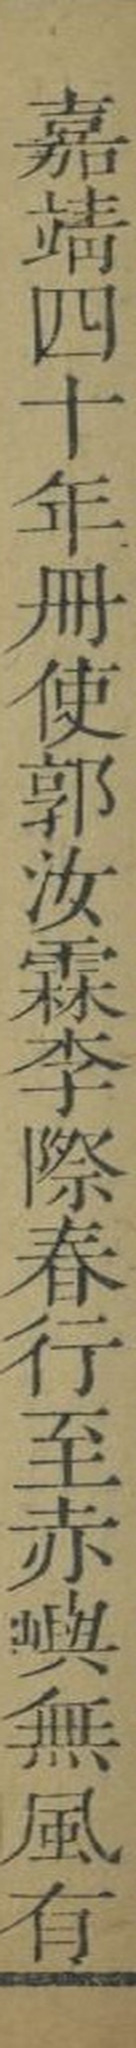嘉靖四十年冊使郭汝霖李際春行至赤嶼無風有
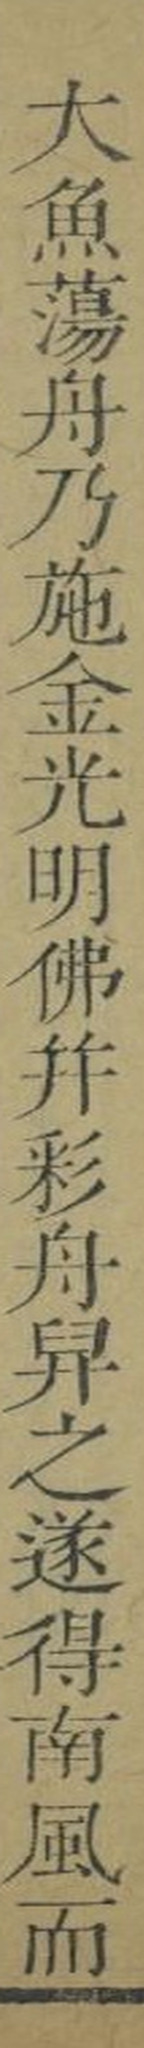大魚蕩舟乃施金光明佛并彩舟舁之遂得南風而
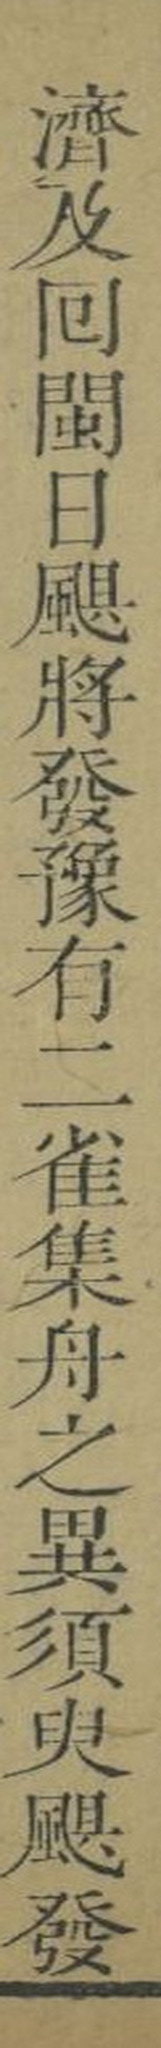濟及囘閩日颶將發豫有二雀集舟之異須臾颶發
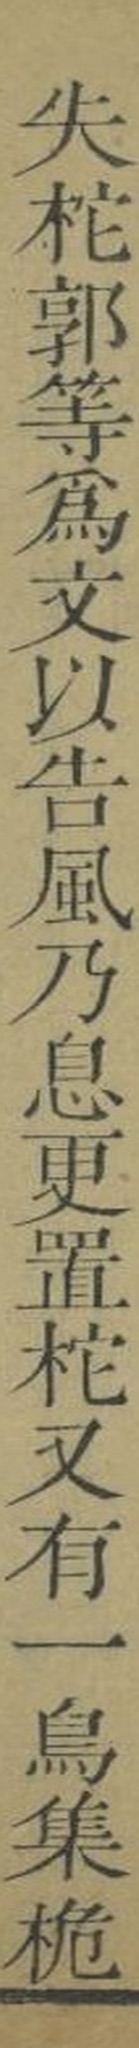失柁郭等爲文以告風乃息更置柁又有一鳥集桅
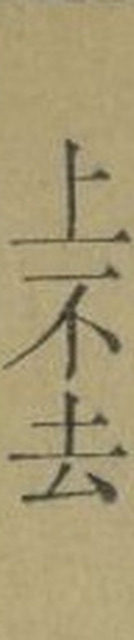上不去
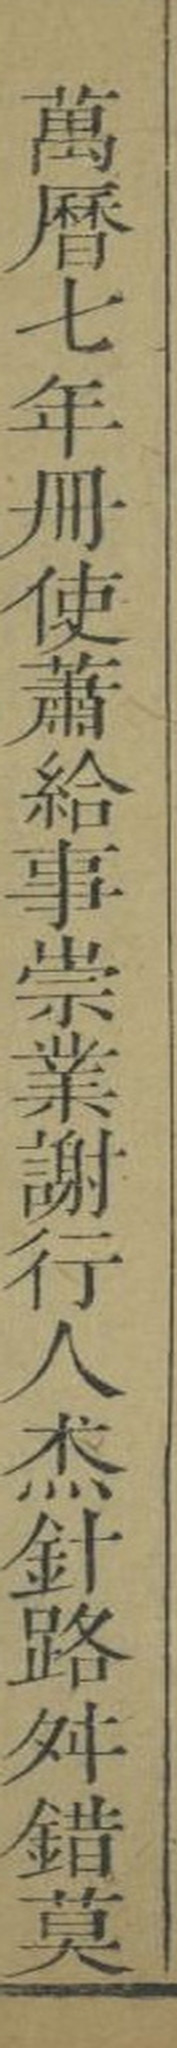萬曆七年冊使蕭給事崇業謝行人然針路舛錯莫
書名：中山伝信録 巻一
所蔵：University of the Ryukyus Library
